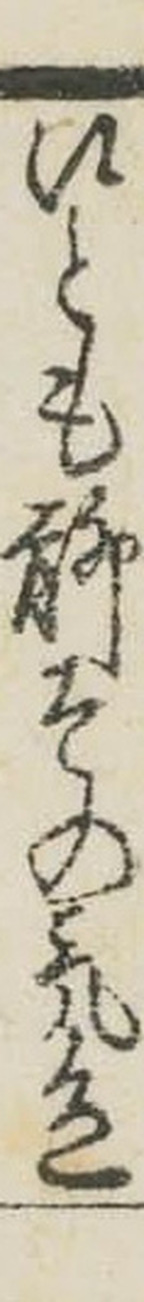候とも聊その気色
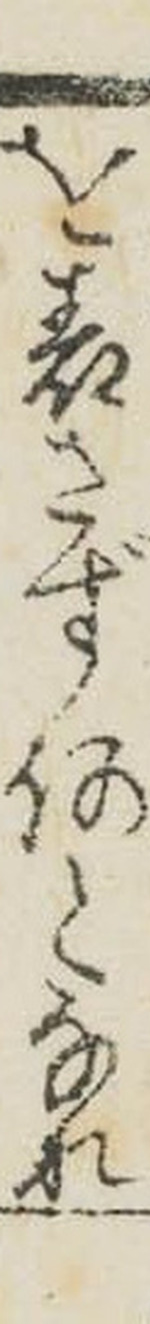を表さず何となれ
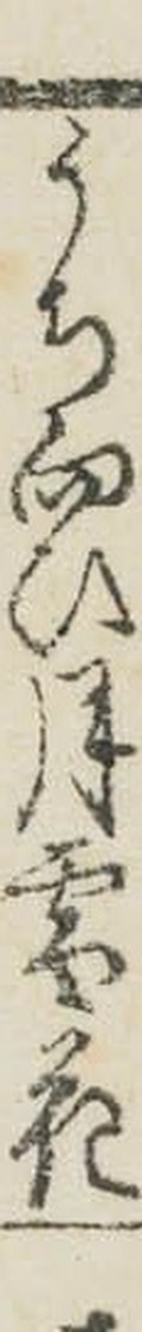うち向ひ月雪花
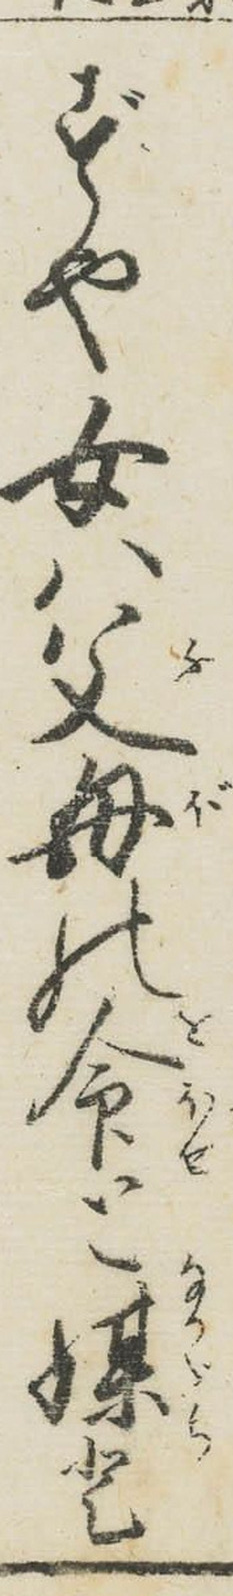ずや女は父母の命と媒と
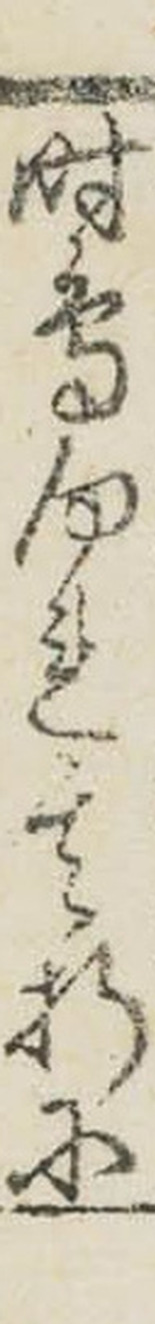時鳥何れ其折に
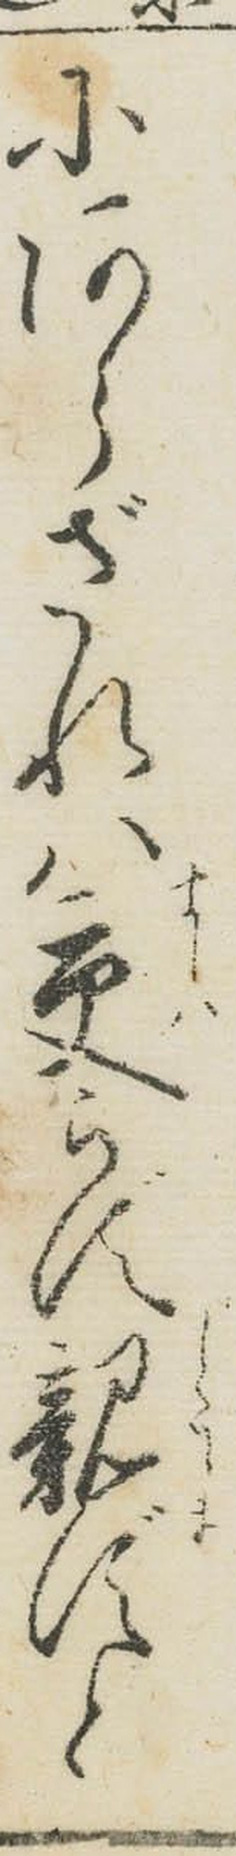にあらざれは交らず親ずと
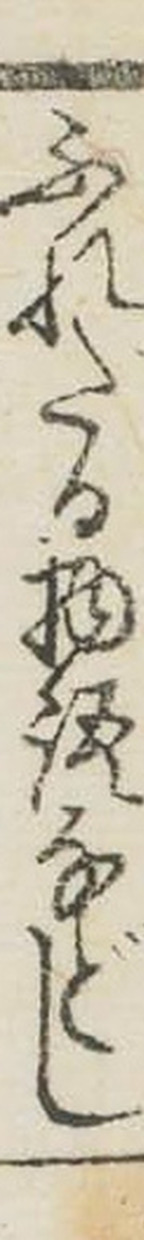ふれたる物語などし
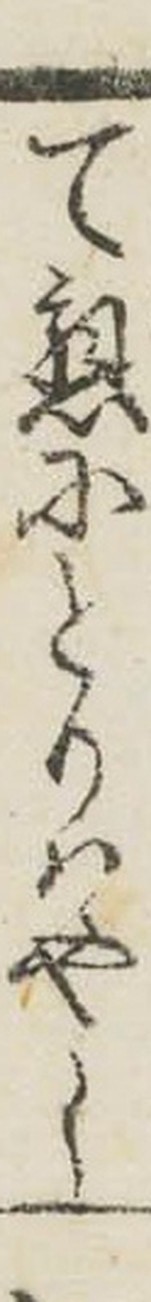て懇にとりはやし
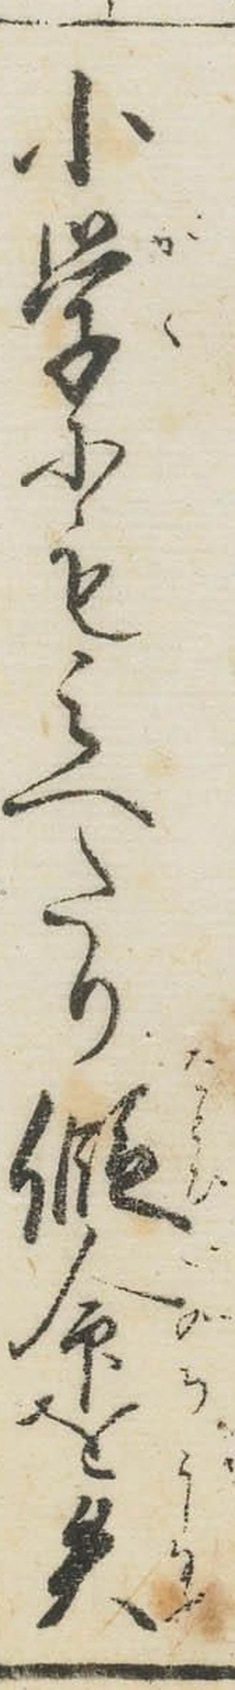小学にもみへたり仮命を失
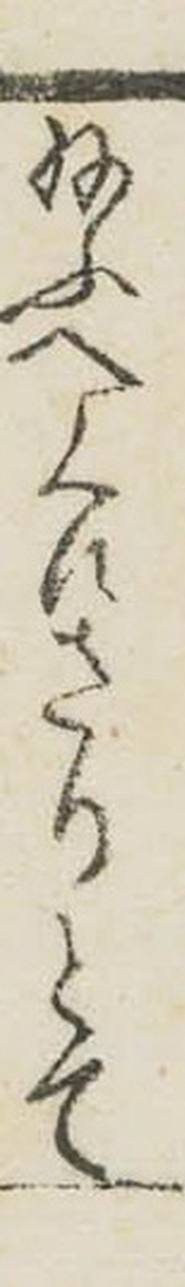給ふへく候さりとて
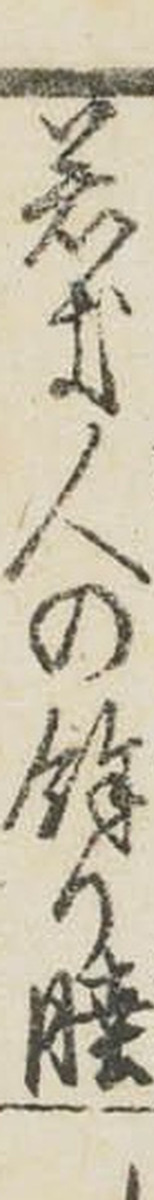若き人の余り睦
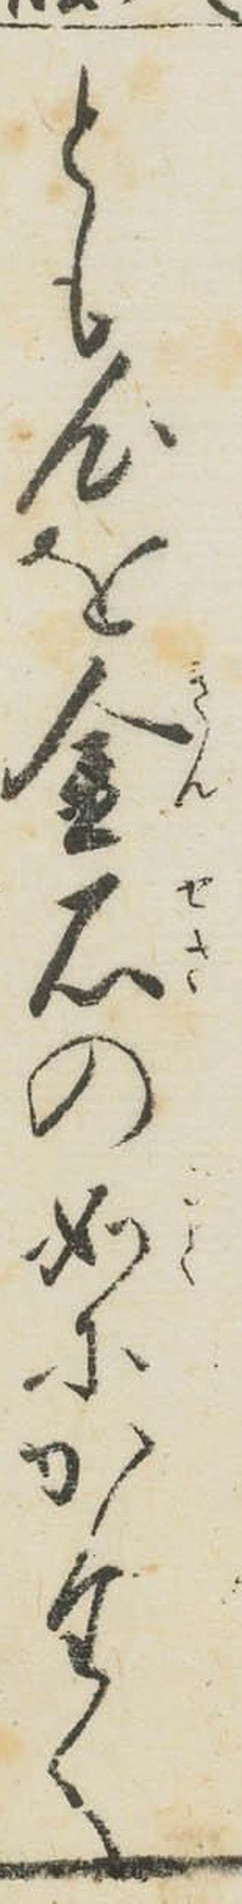とも心を金石の如にかたく
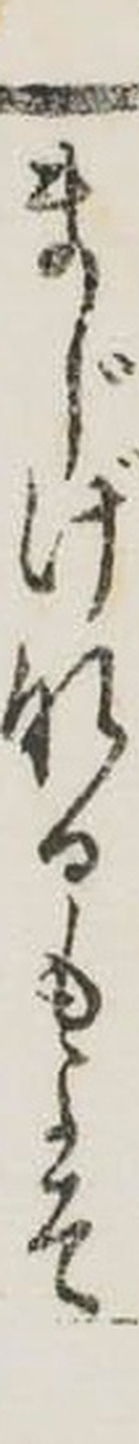まじげなるもよそ
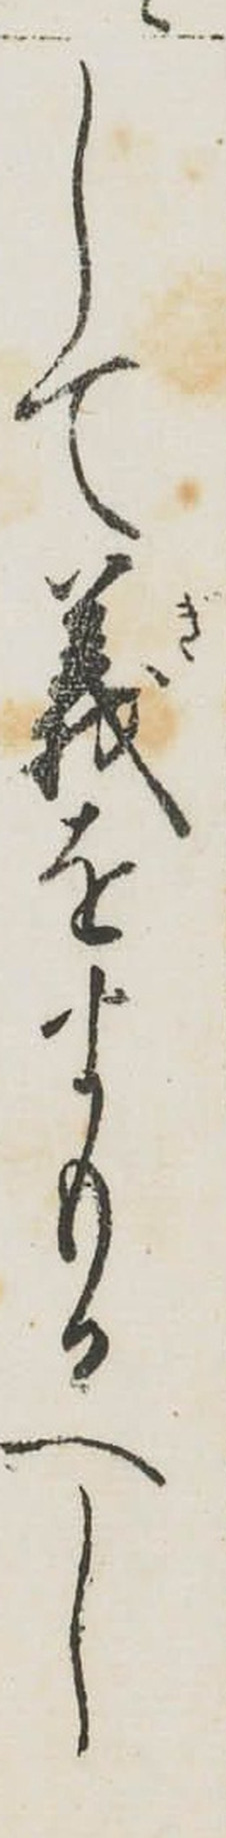して義をまもるへし
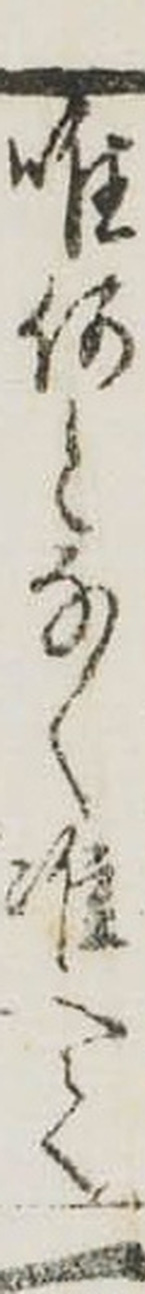唯何となく准へて
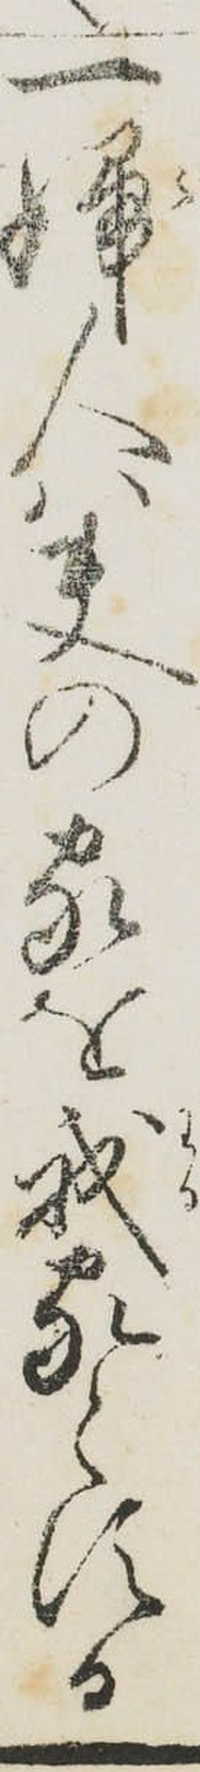一婦人は夫の家を我家とする
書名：女大学
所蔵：東京学芸大学教育コンテンツアーカイブ
